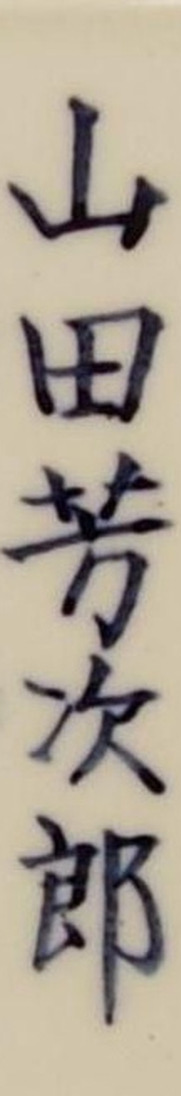山田芳次郎
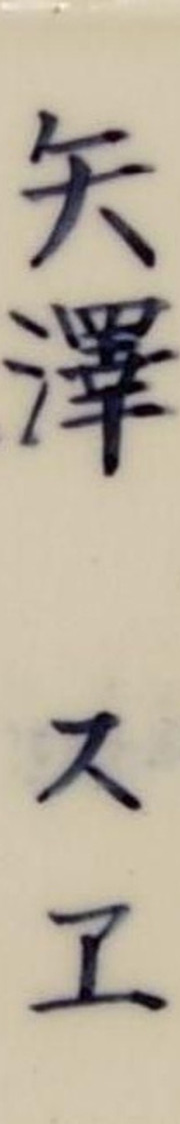矢澤スエ
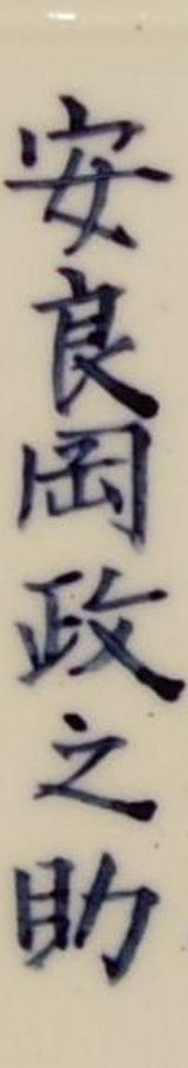安良岡政之助
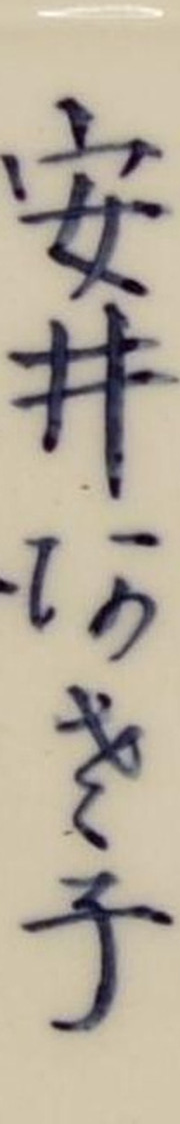安井あさ子
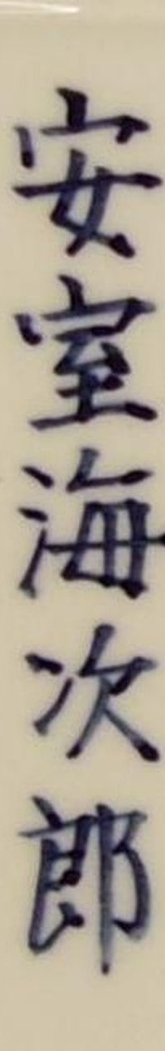安室海次郎
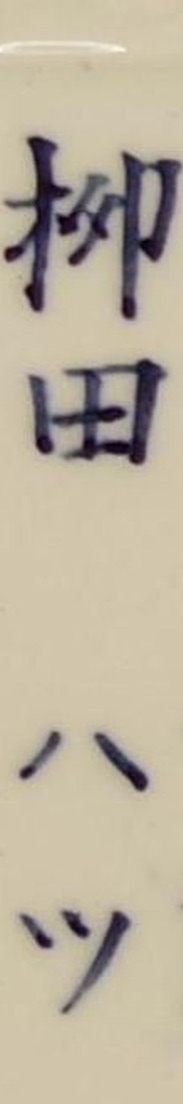柳田ハツ
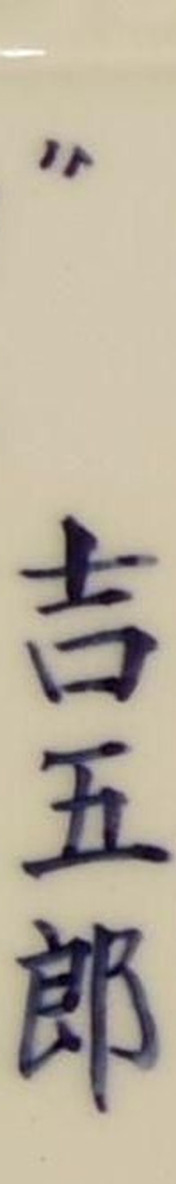吉五郎
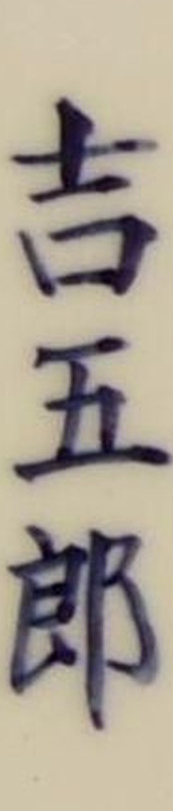吉五郎
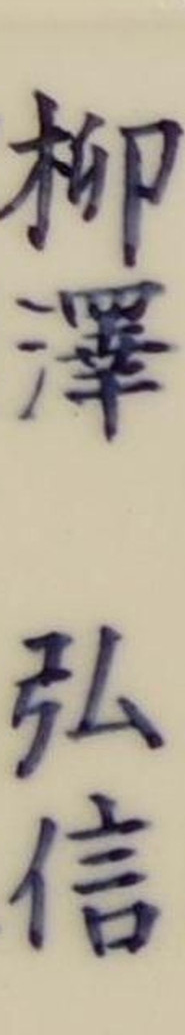柳澤弘信
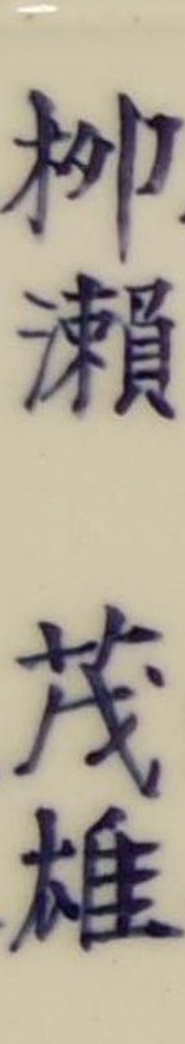柳瀬茂雄
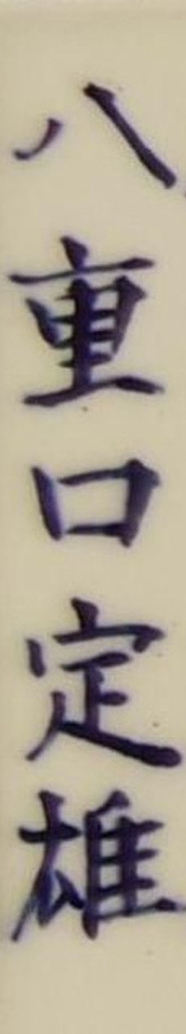八重口定雄

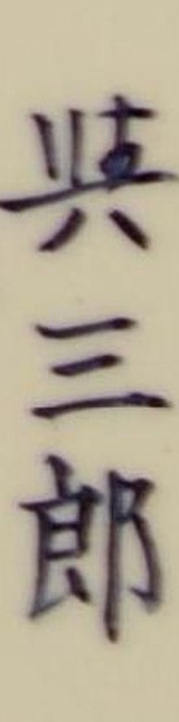与三郎
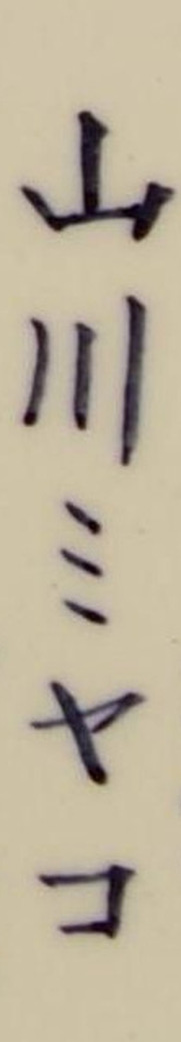山川ミヤコ
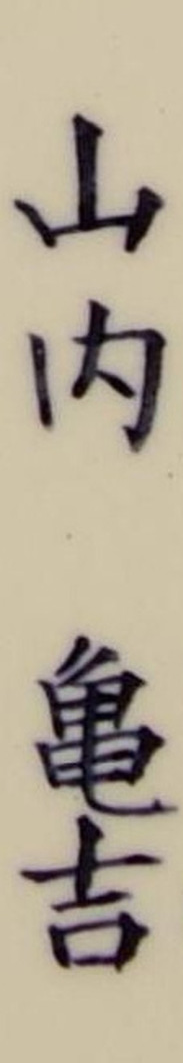山内亀吉
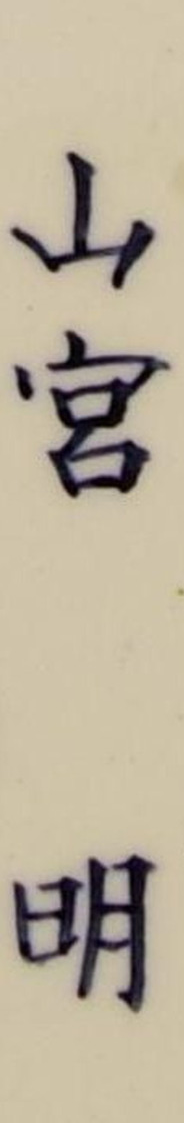山宮明
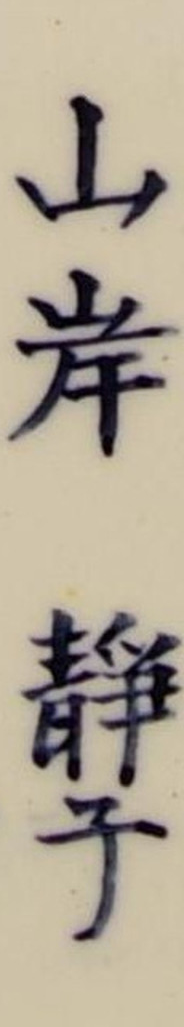山岸静子
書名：E~L
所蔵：高野山金剛峯寺
